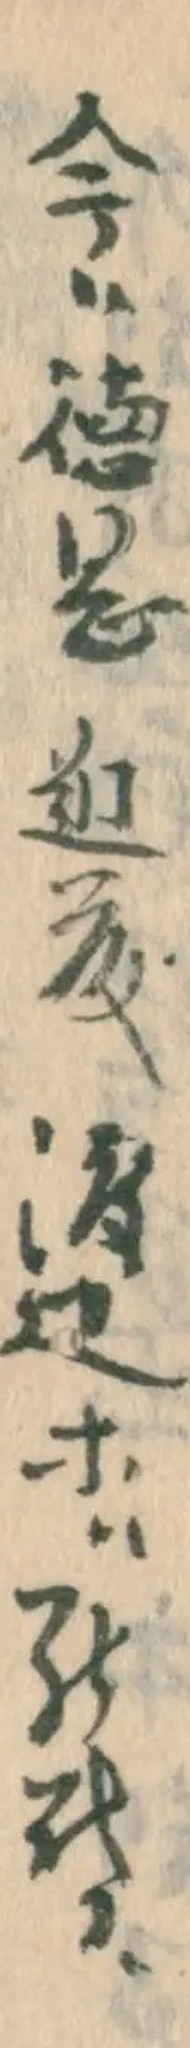今日徳岡近藤渡辺等ハ罷越ス
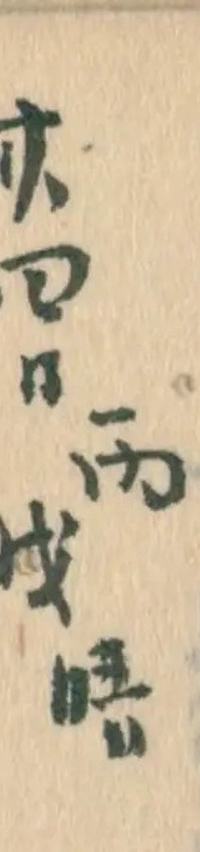廿四日丙戌晴
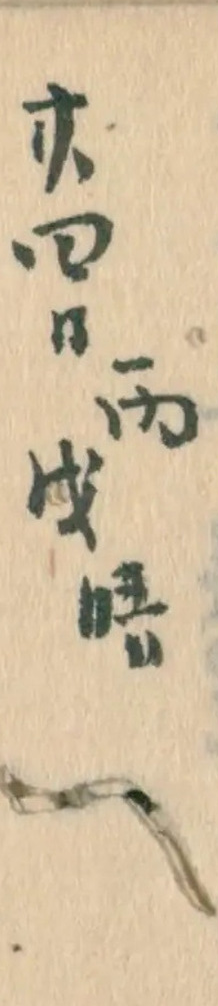廿四日丙戌晴
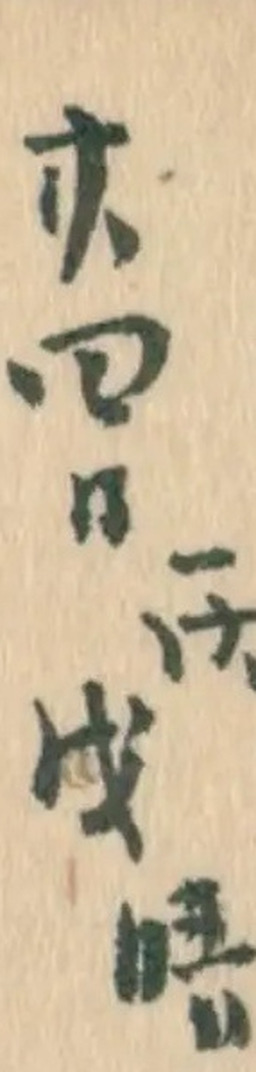廿四日丙戌晴
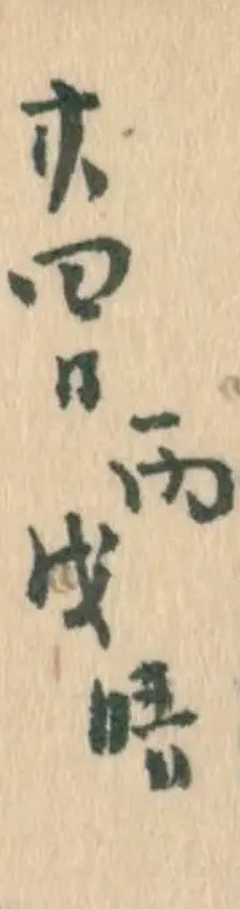廿四日丙戌晴

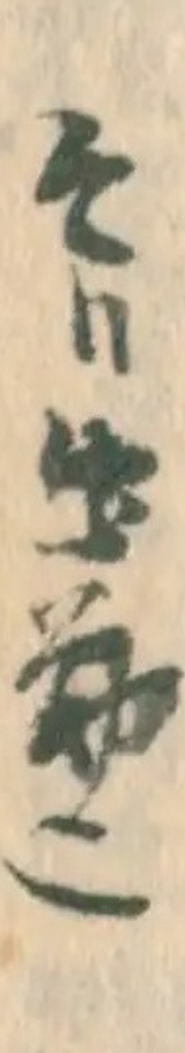今日出勤也
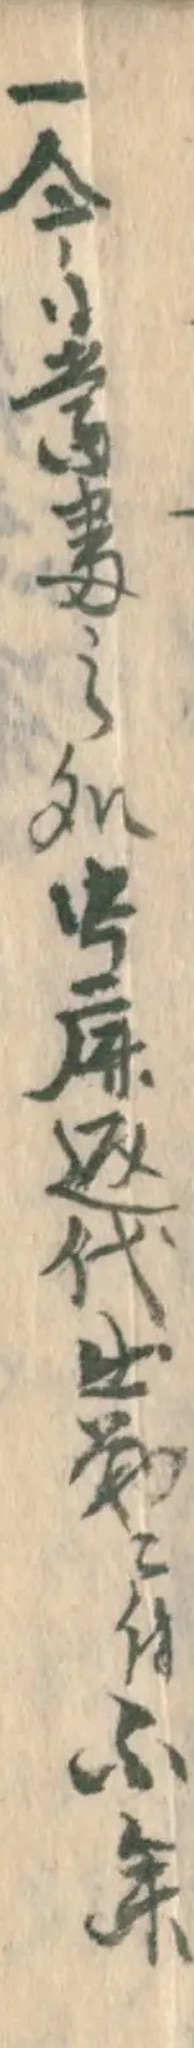一今日当番之処虫鹿返代出勤ニ付不参
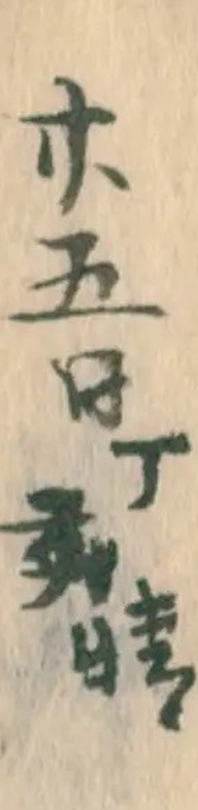廿五日丁亥晴
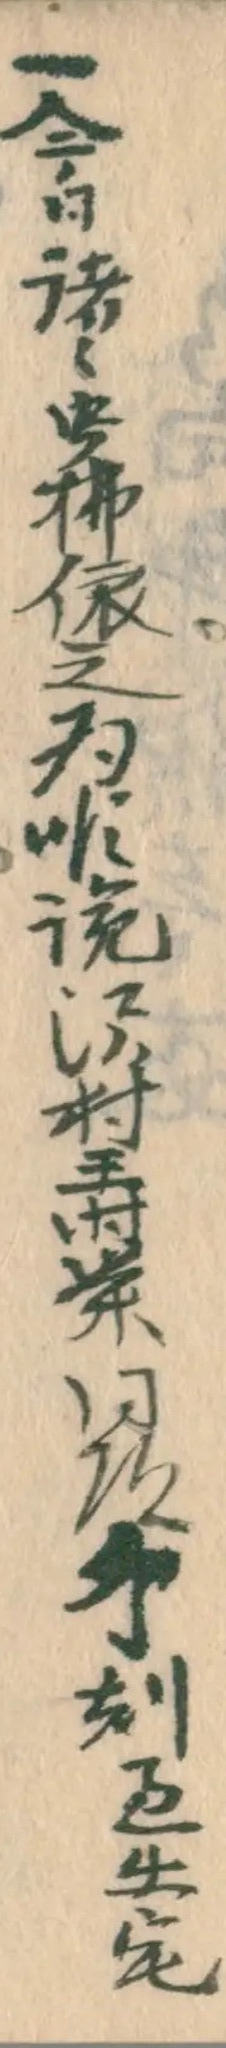一今日諸々虫払依之為順覧沢村寿栄同道卯刻過出宅
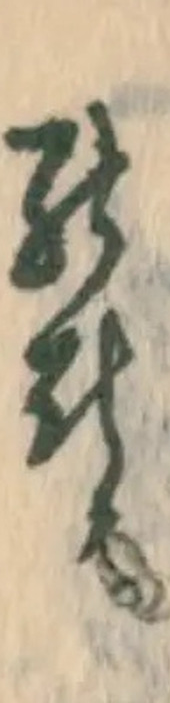罷越ス
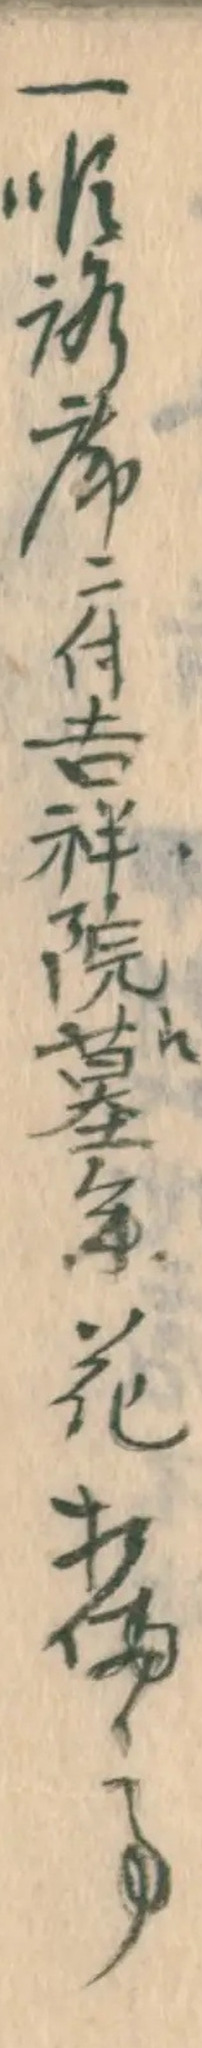一順路序ニ付吉祥院え墓参花相備候事
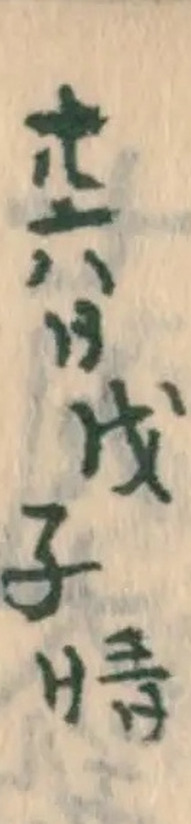廿六日戊子晴
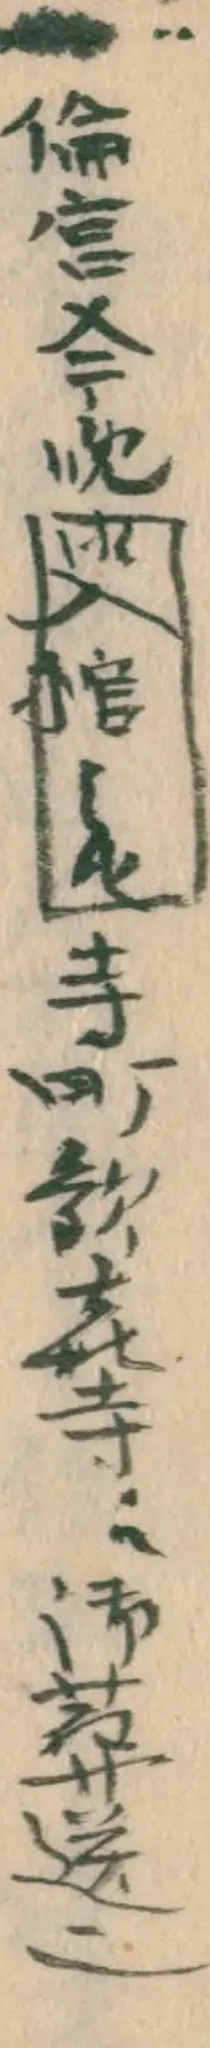一倫宮今晩御入棺之由寺町歓喜寺え御葬送也
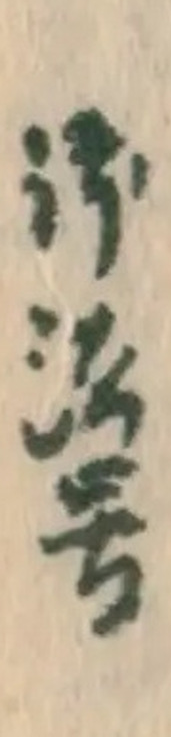御法号
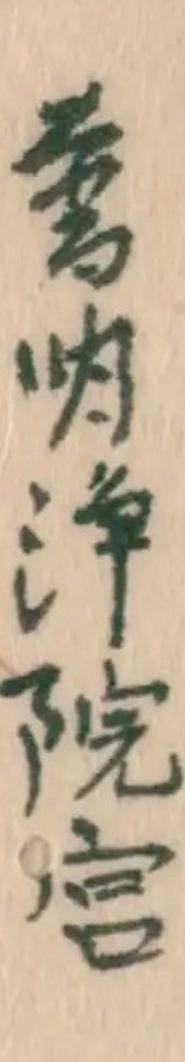普明浄院宮
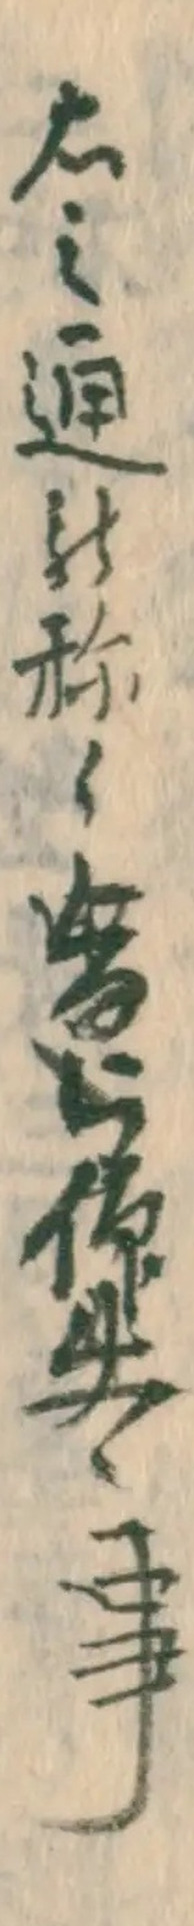右之通の称候旨被仰出候事
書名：禁裏御所御用日記. [131]
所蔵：国立国会図書館 National Diet Library, JAPAN
